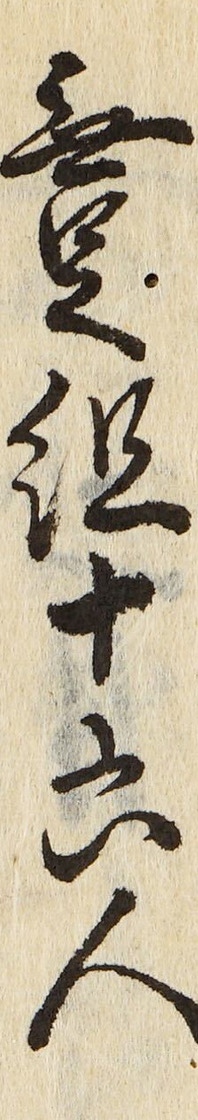無足組十六人
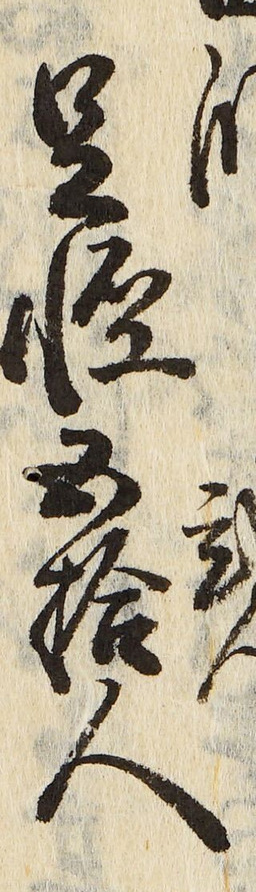足軽五拾人
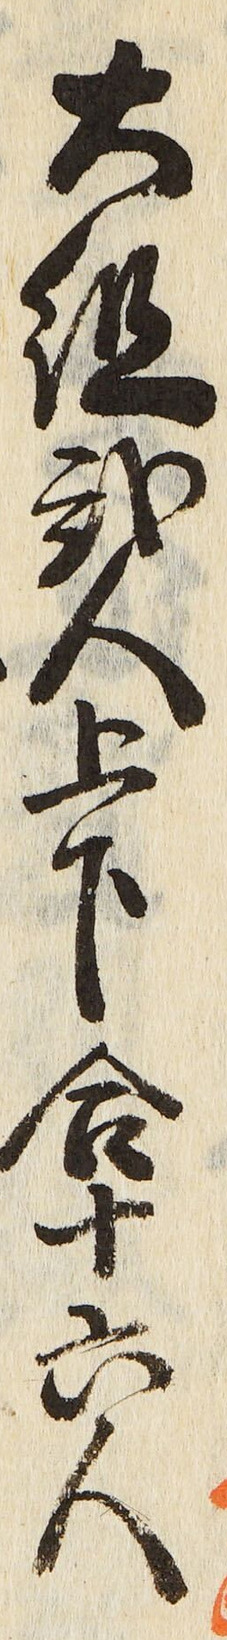大組弐人上下合十六人
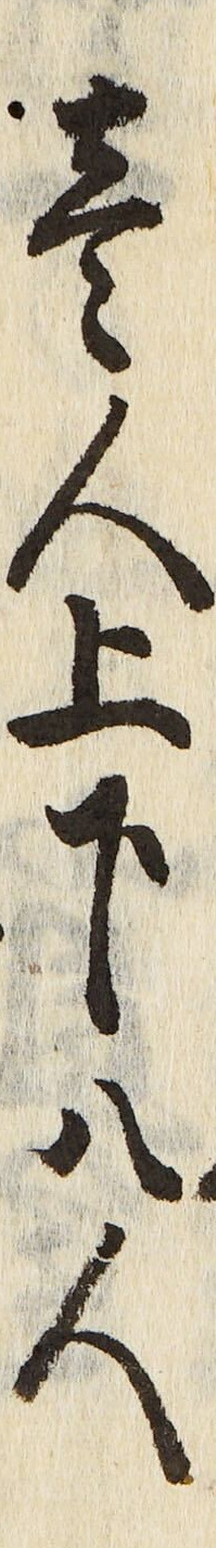壱人上下八人
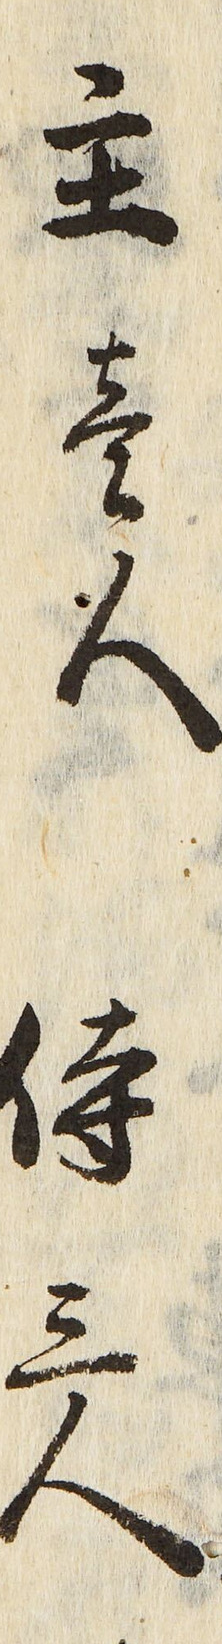主壱人侍三人
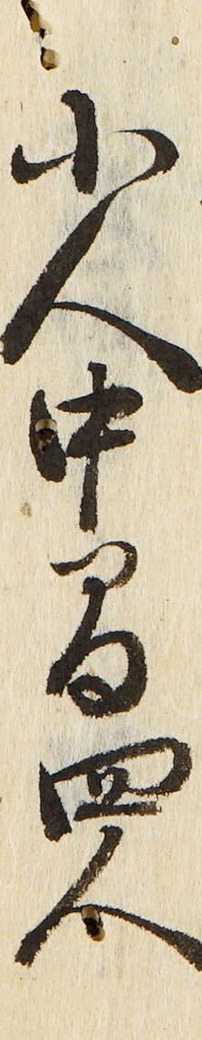小人中間四人
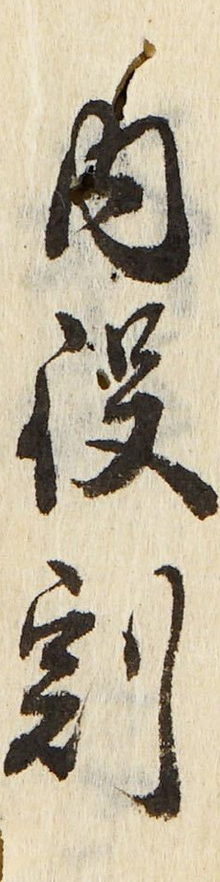内役割
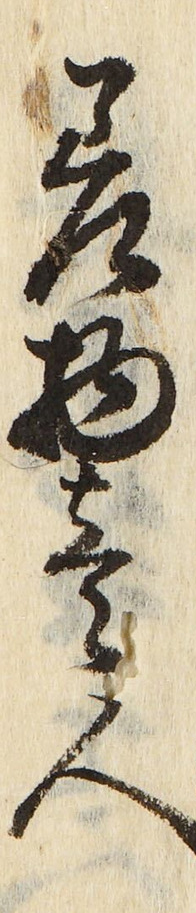差物壱人

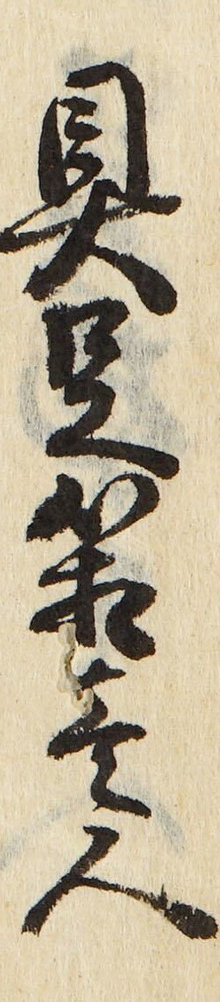具足箱壱人
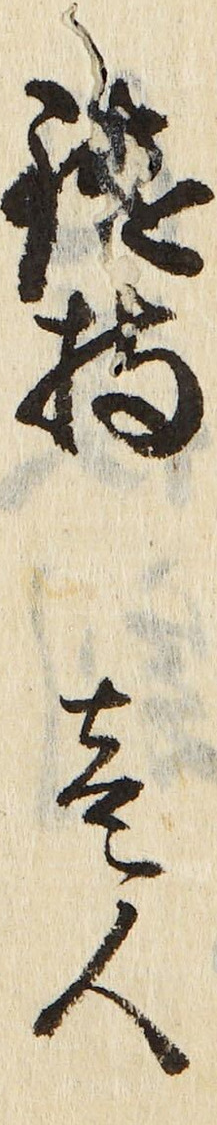鑓持壱人
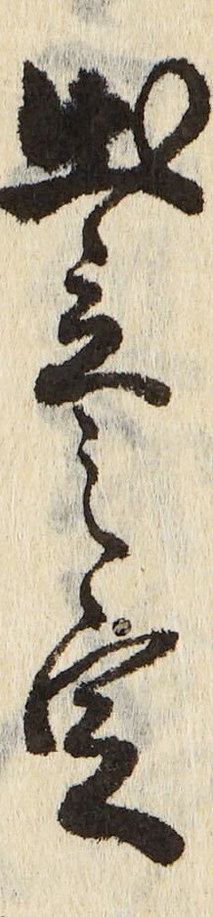出立之定
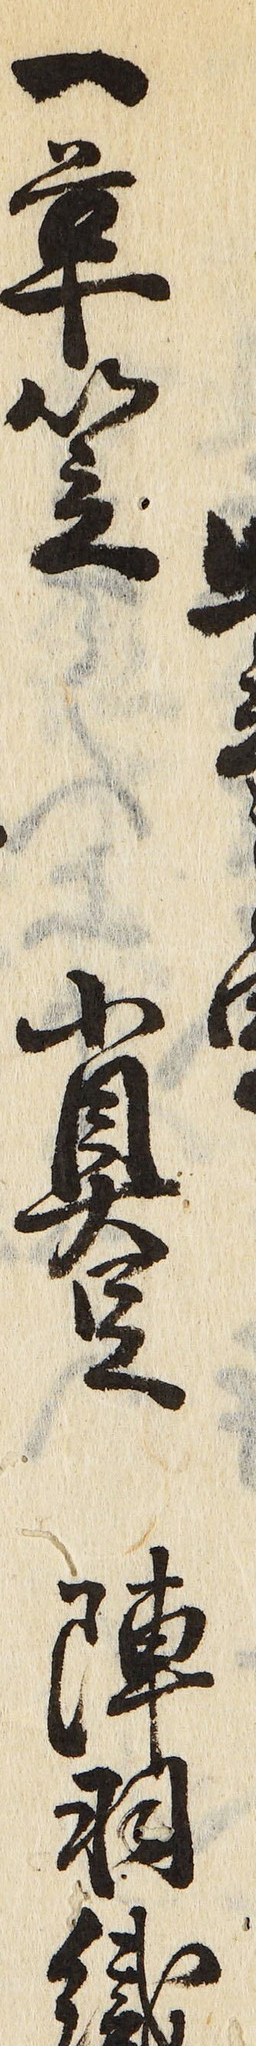一革笠小具足陣羽織
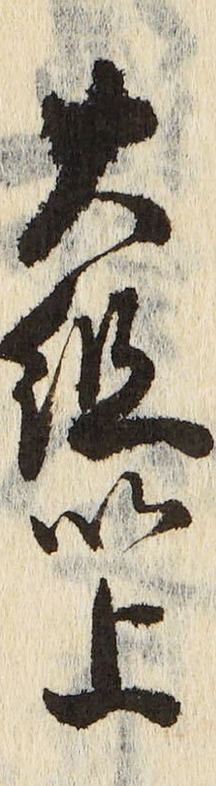大組以上
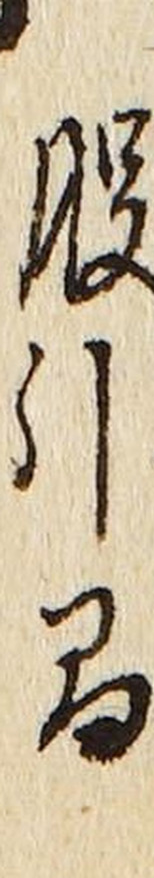股引間
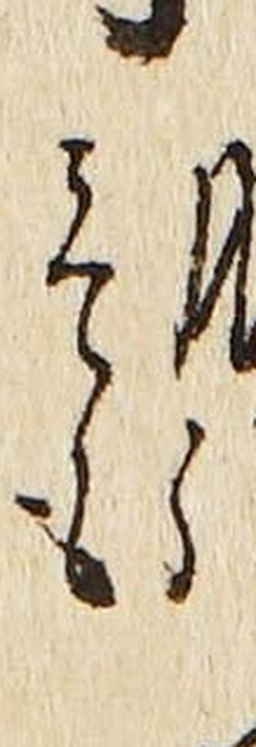ニても
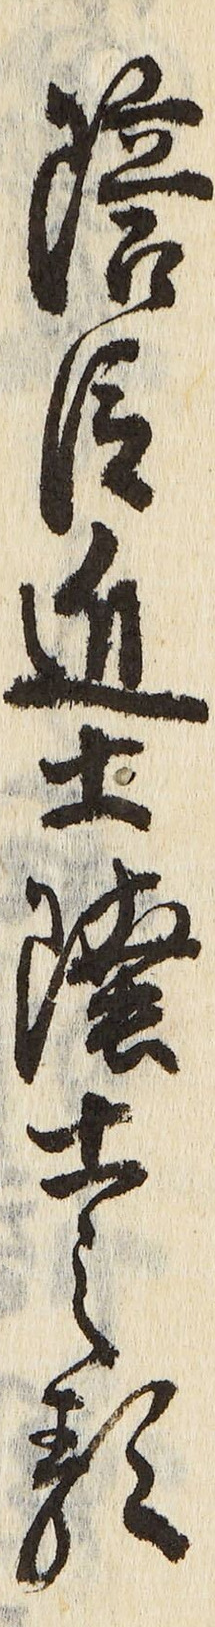陪臣近士陸士之類
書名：御領海江異国船漂流有之節御手当之次第大組頭心得之廉々書集記
